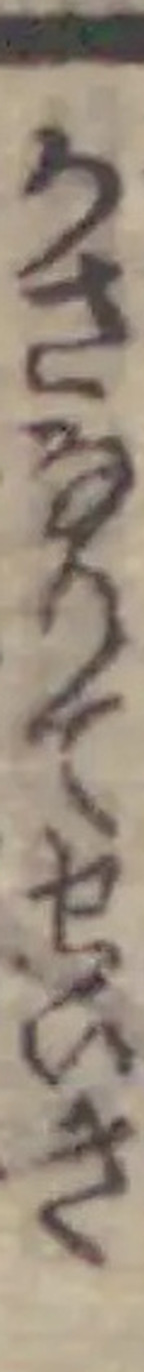かさなりてせいき
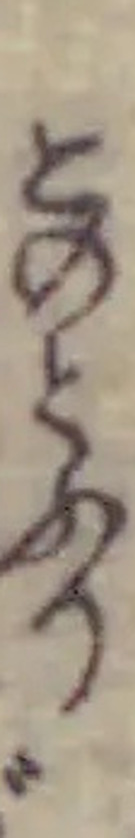このとふり
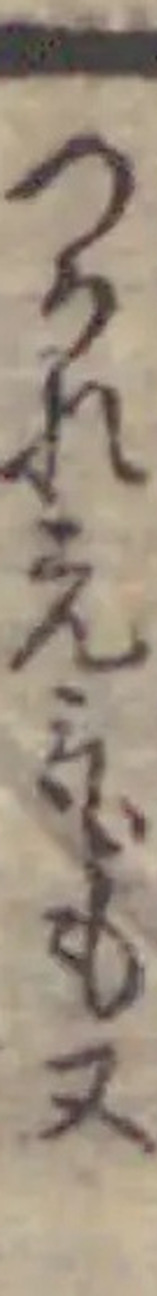つかれ元気も又
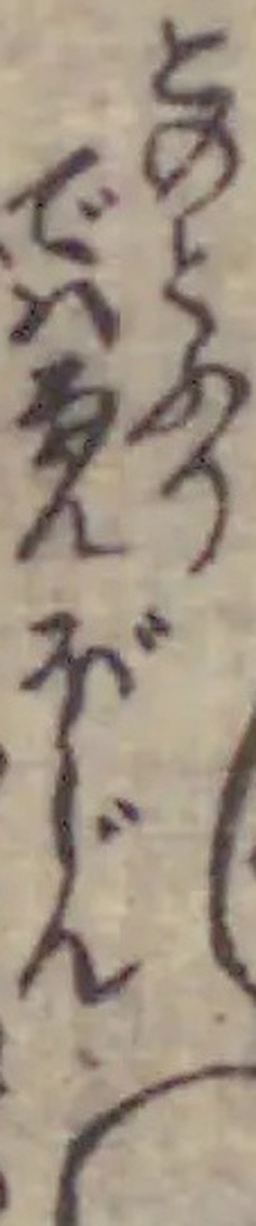ではなんぼじん
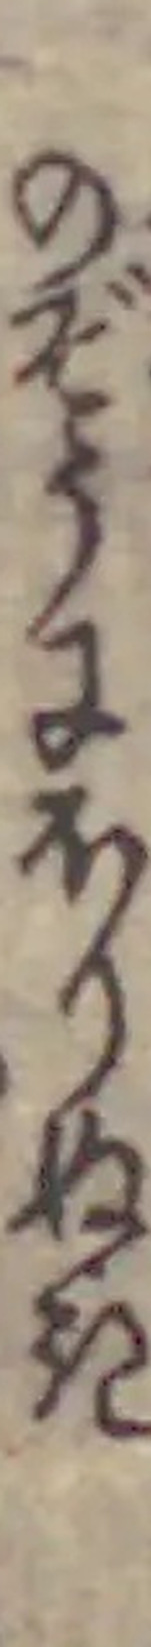のぞうにほりぬき
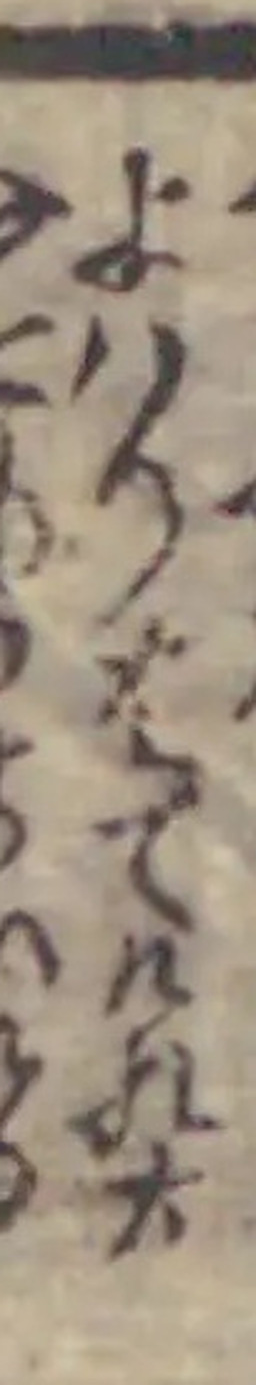なをもかよいける
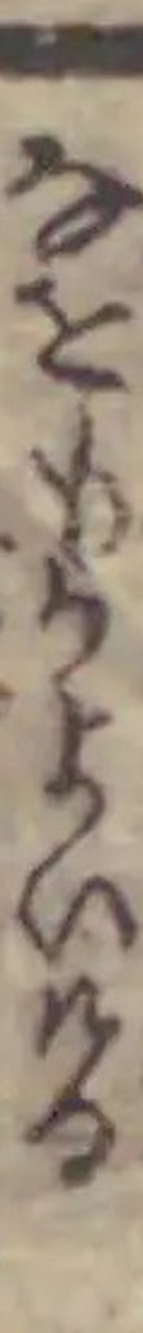なをもかよいける
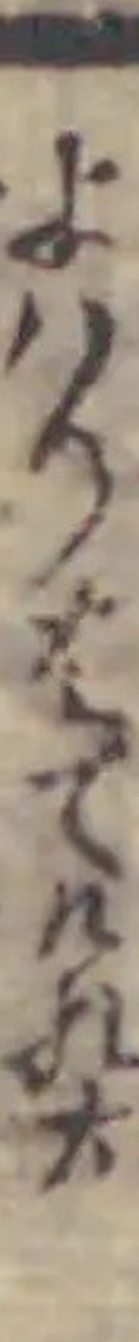よはりはてけれ共
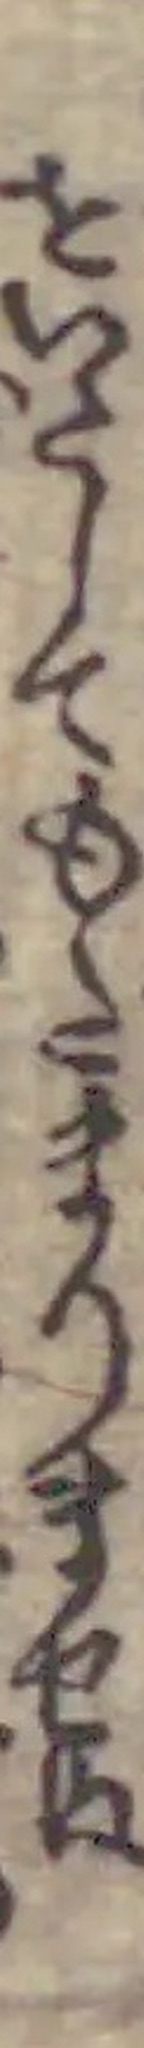をいたしてもたまりませぬ
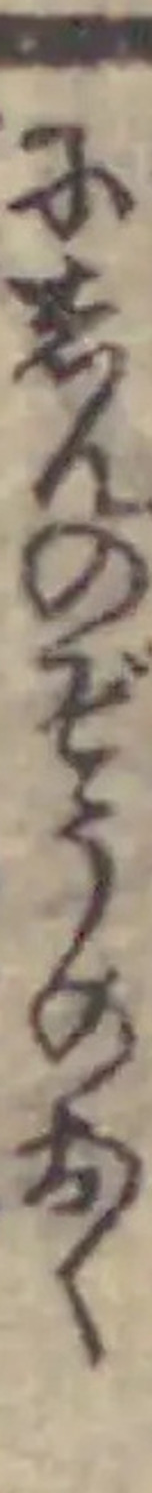にしんのぞうのおく
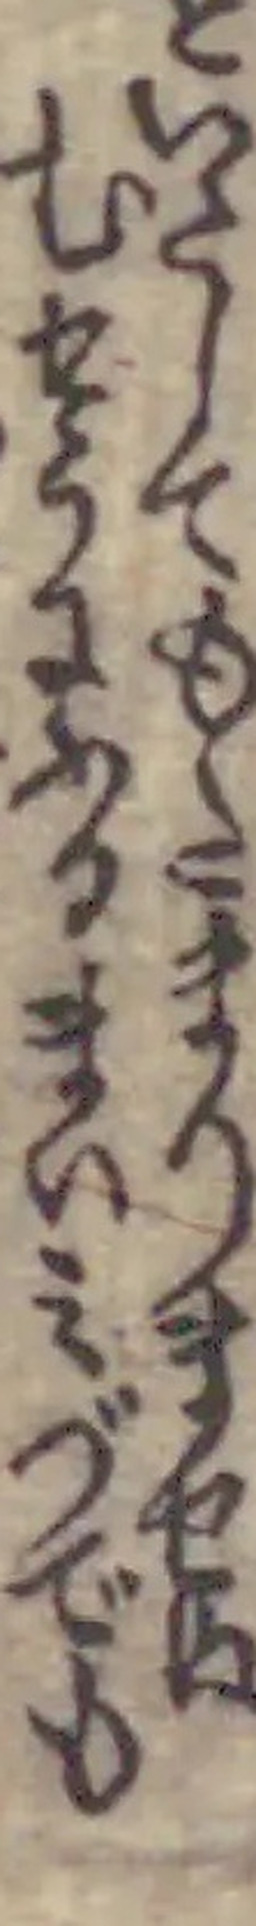むせうにふるまいみづでも
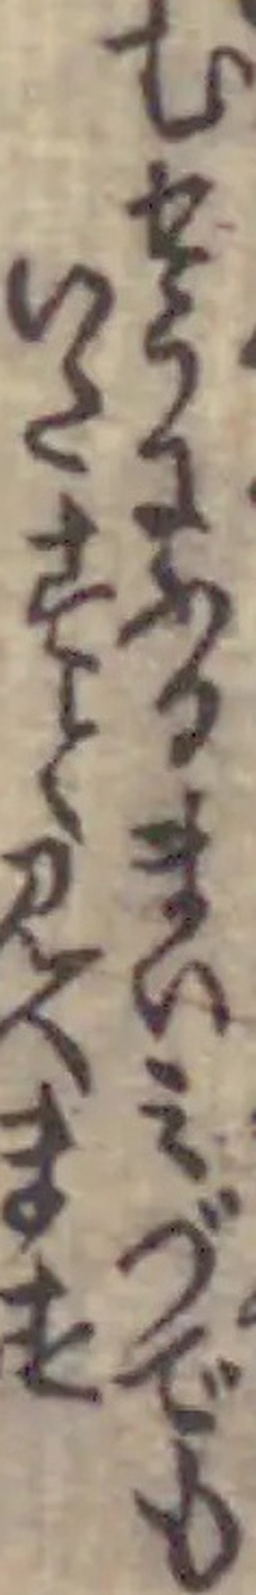いたすと見へます
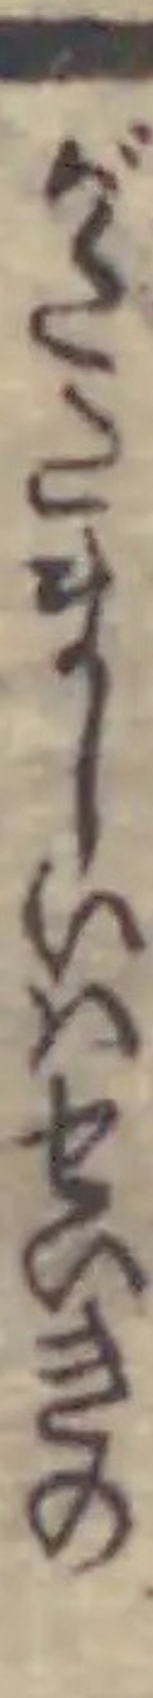がたたましいはせいきの
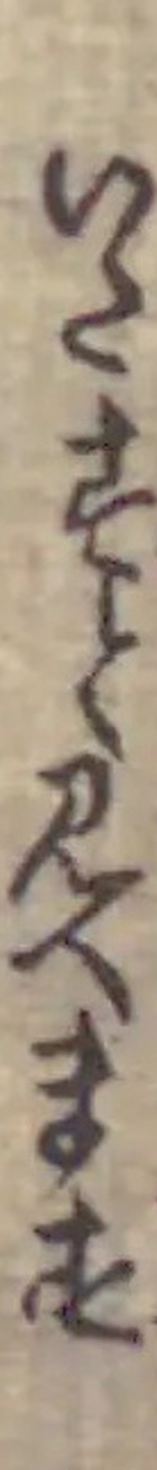いたすと見へます
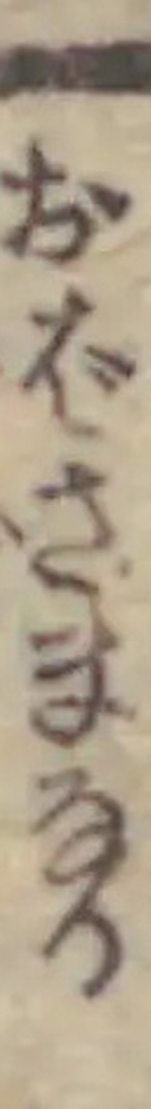おばさまなり
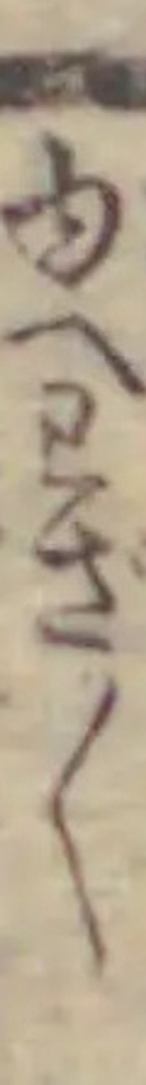ゆへわざ〳〵
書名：腹内養生主論 3巻
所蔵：国立国会図書館 National Diet Library, JAPAN
